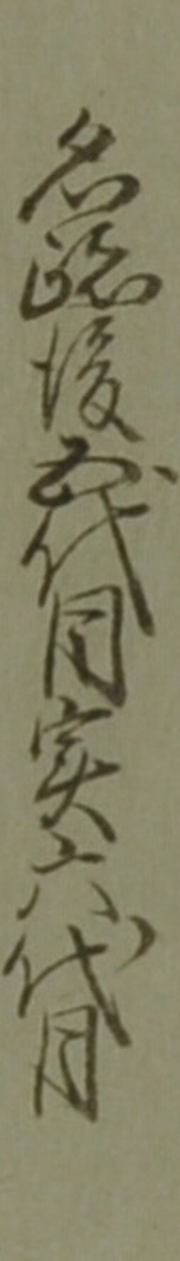名跡後五代目実六代目
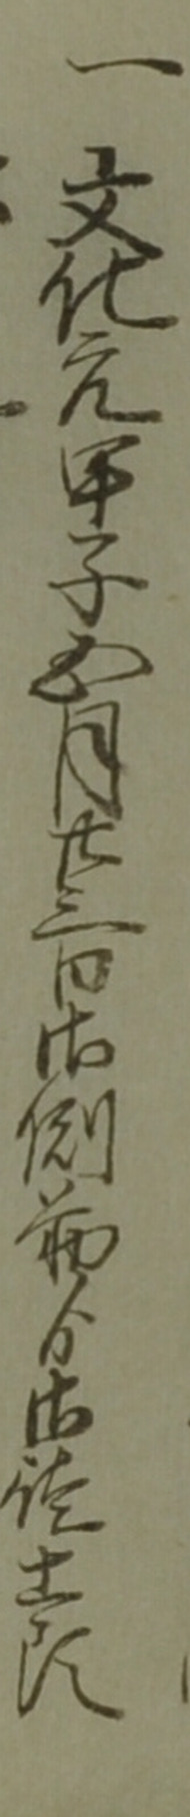一文化元甲子五月廿三日御側勤ゟ御徒士頭
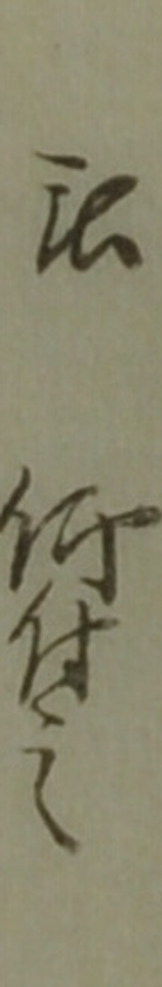被仰付之
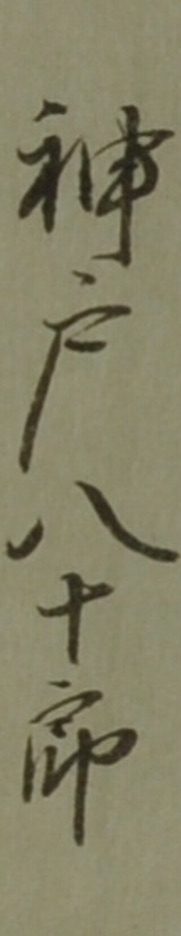神戸八十郎
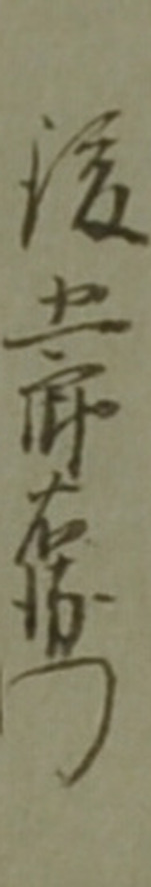後五郎右衛門
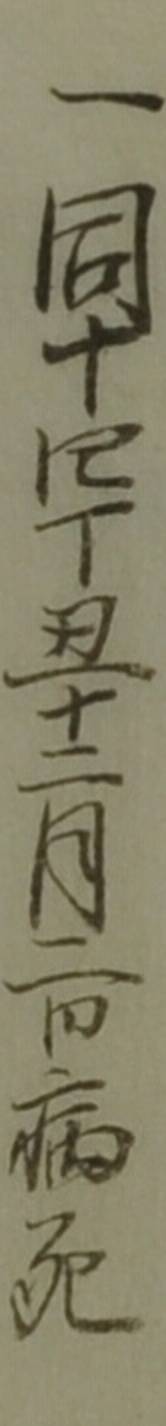一同十四丁丑十二月二日病死
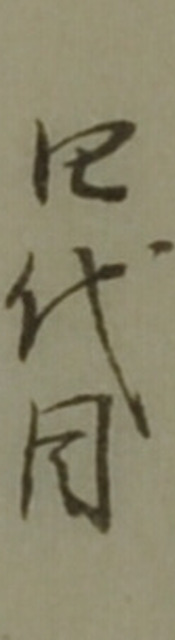四代目
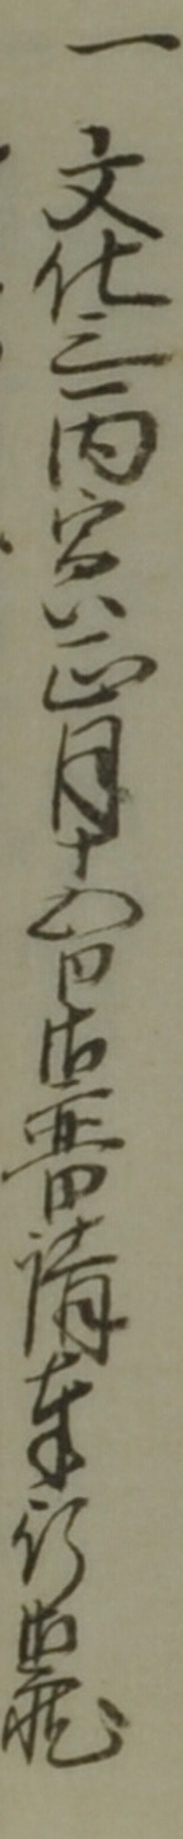一文化三丙寅正月十五日御普請奉行御蔵
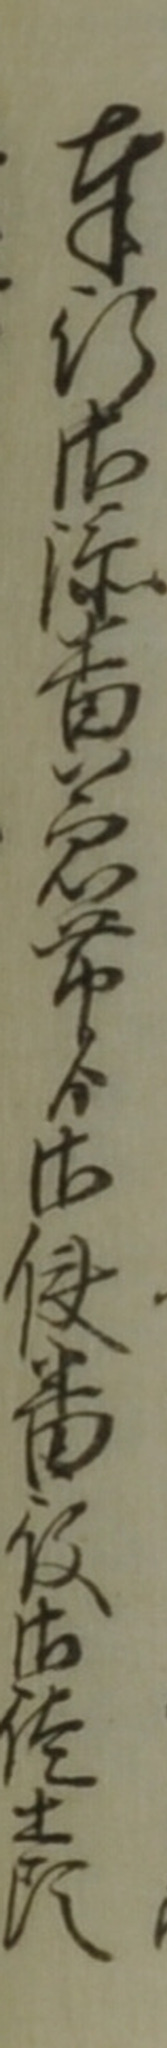奉行御添番兼帯ゟ御使番役御徒士頭
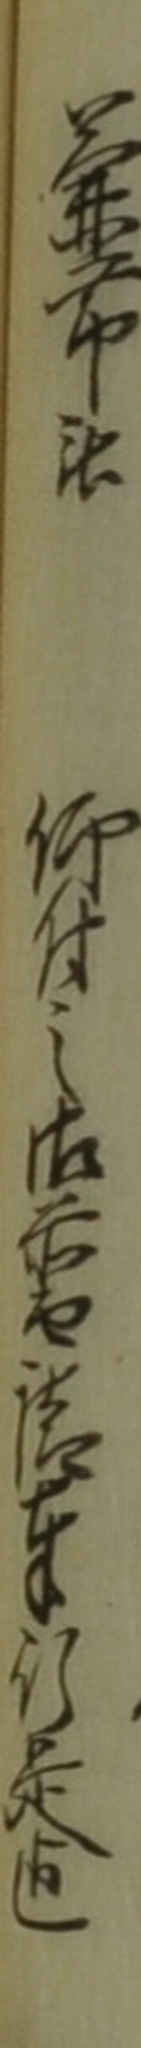兼帯被仰付之御普請奉行是迄
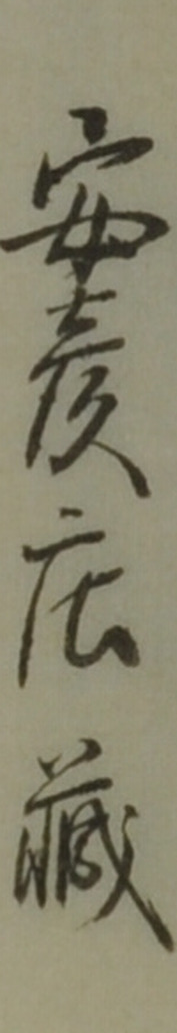安彦庄蔵
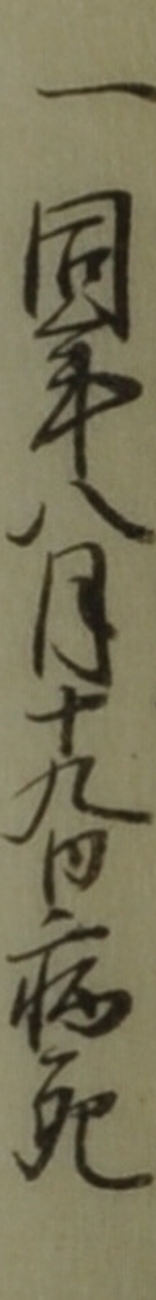一同年八月十九日病死
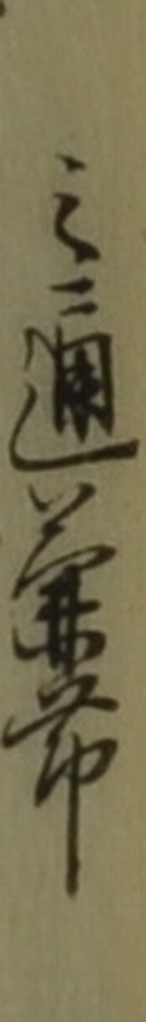之通兼帯
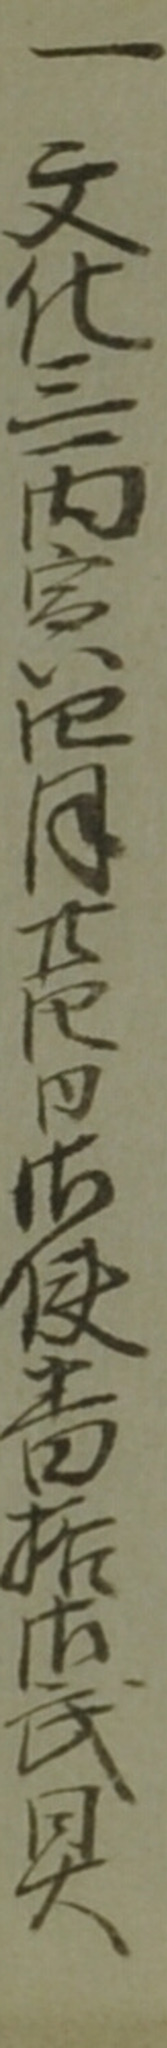一文化三丙寅四月廿四日御使番格御武具
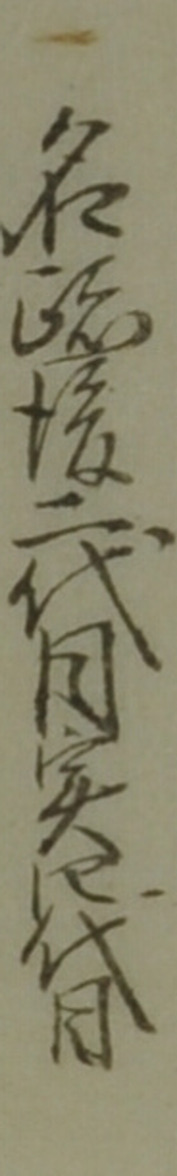名跡後二代目実四代目
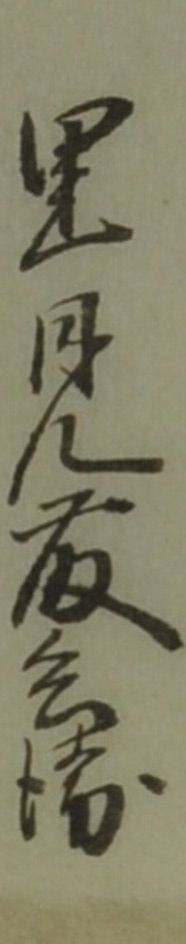里見藤兵衛
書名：諸御役代々録（六）
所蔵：伊那市立高遠町図書館・合同会社AMANE
